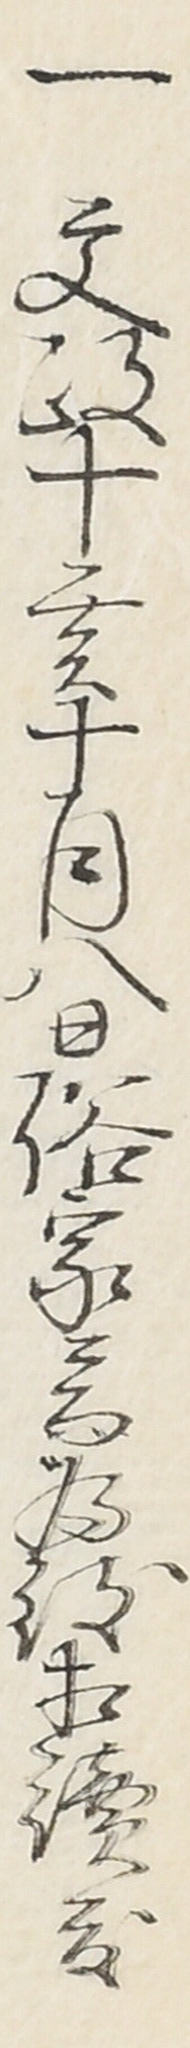一文政十亥十月八日俗家ニ而為致相続度
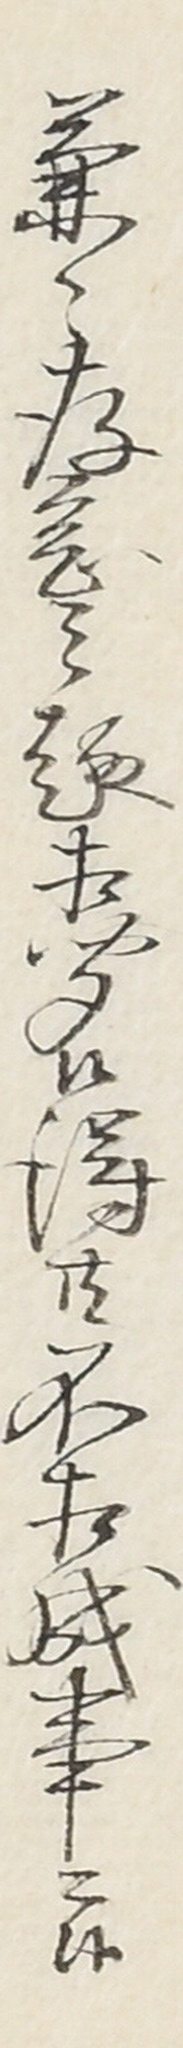兼佐々存念之趣相聞候得共不相成事ニ候
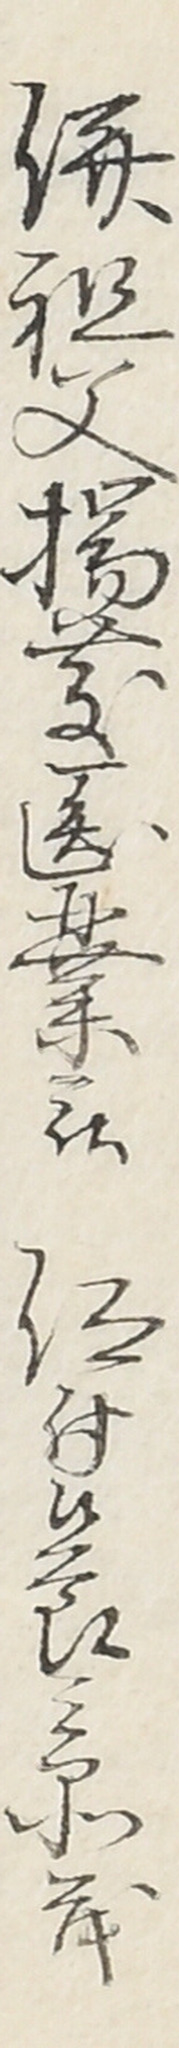併祖父揚慶医業被仰付候節之品も
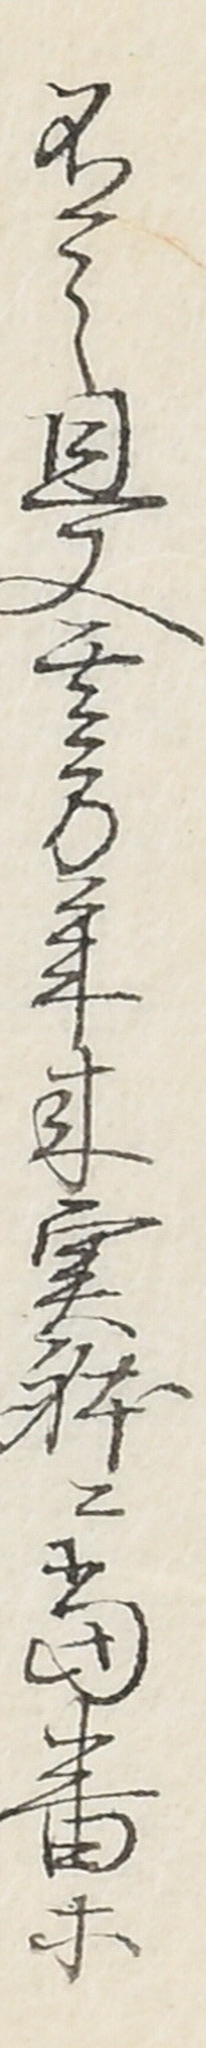有之且又其方年来実躰ニ当番等
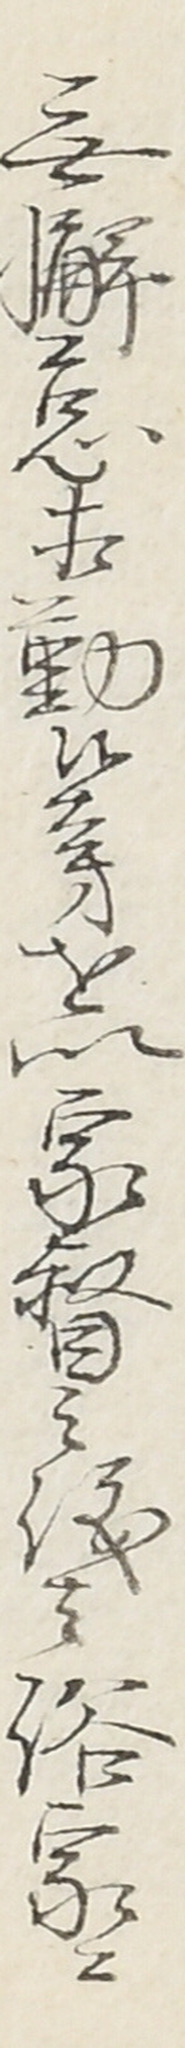無懈怠相勤候旁を以家督之儀は俗家ニ
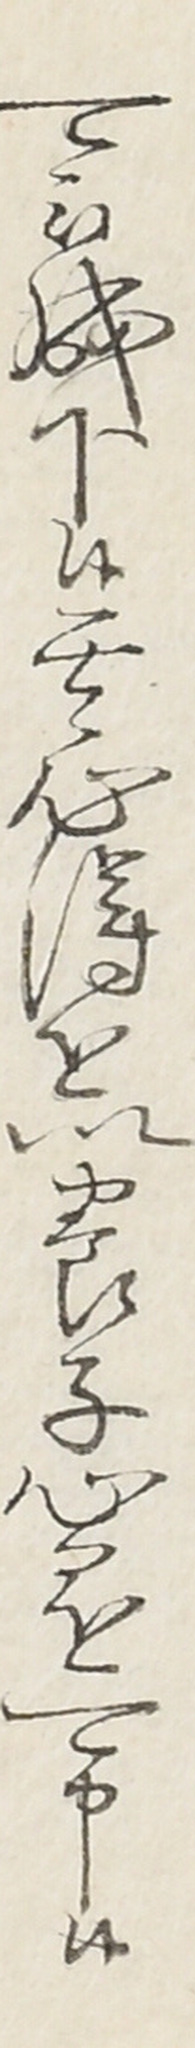可被成下候其心得を以養子心懸可申候
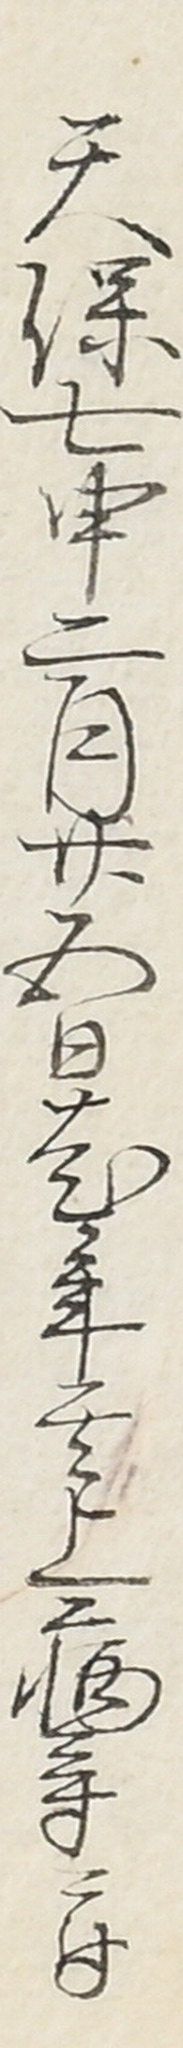一天保七申二月廿五日老年其上病気ニ付
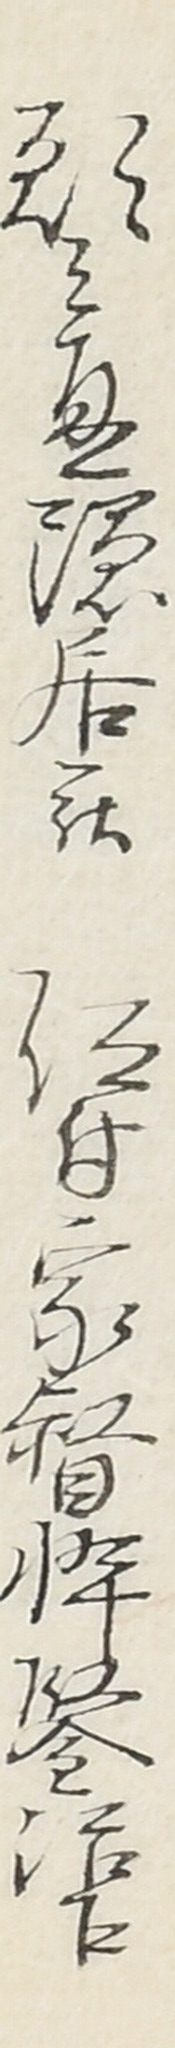願之通隠居被仰付家督忰鋻治江
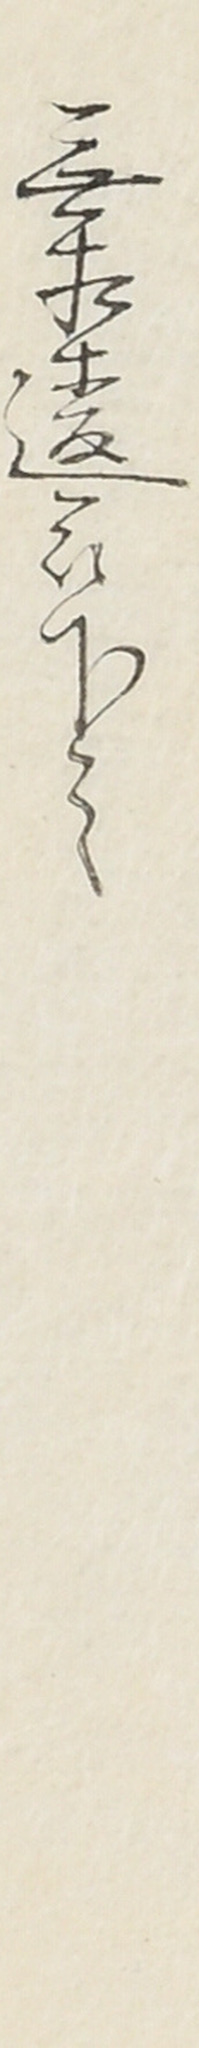無相違被下之
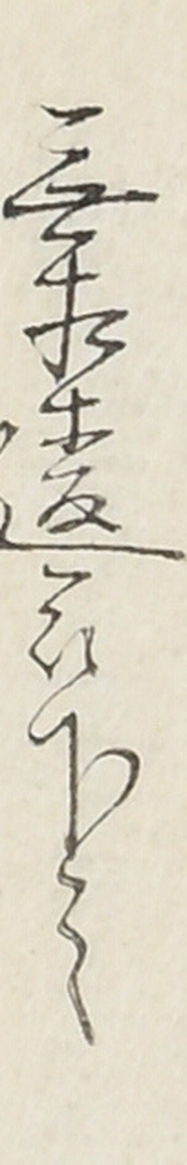無相違被下之
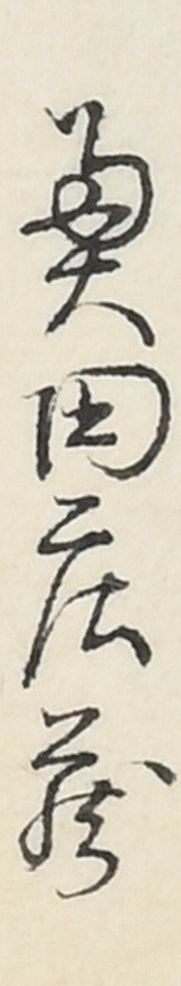奥田庄蔵

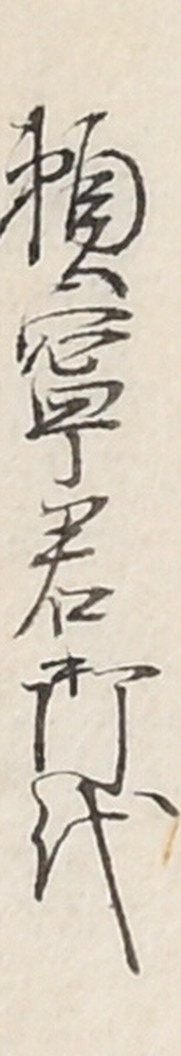頼寧君御代
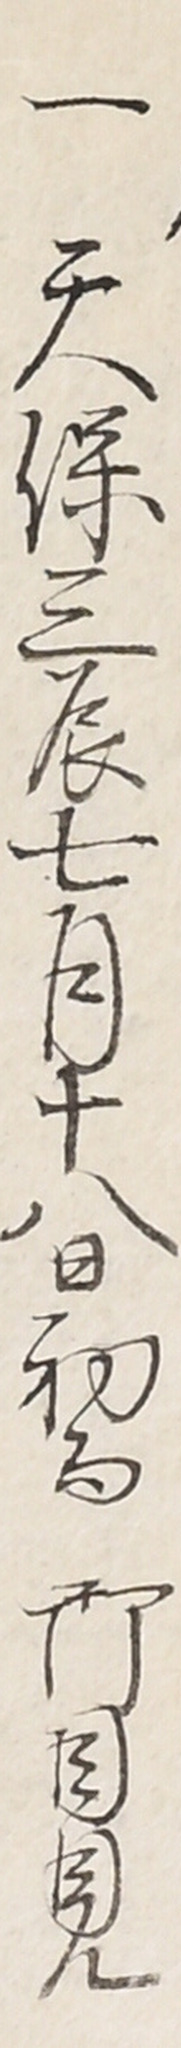一天保三辰七月十八日初而御目見
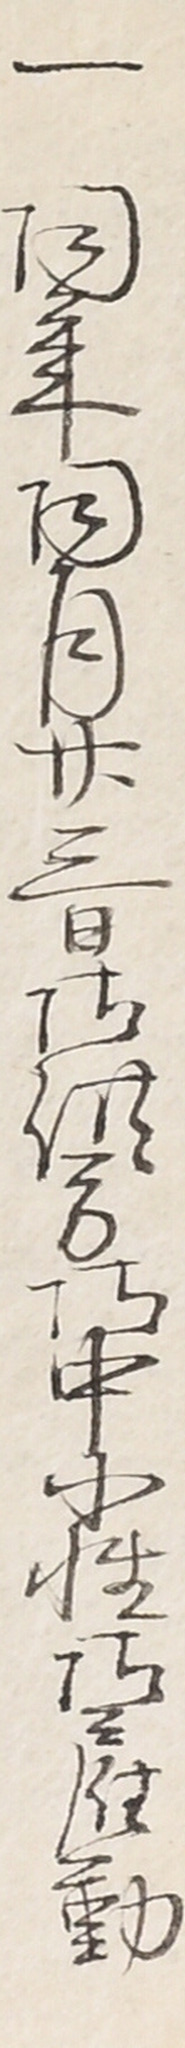一同年同月廿三日御供方御中小性御雇勤
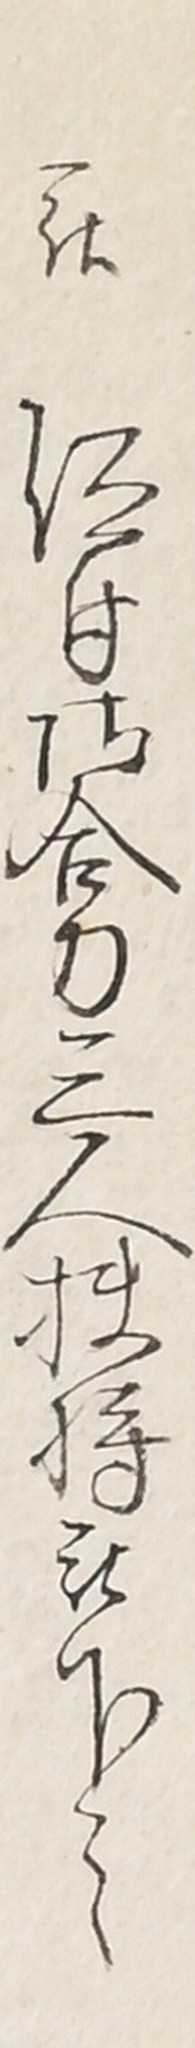被仰付御合力三人扶持被下之
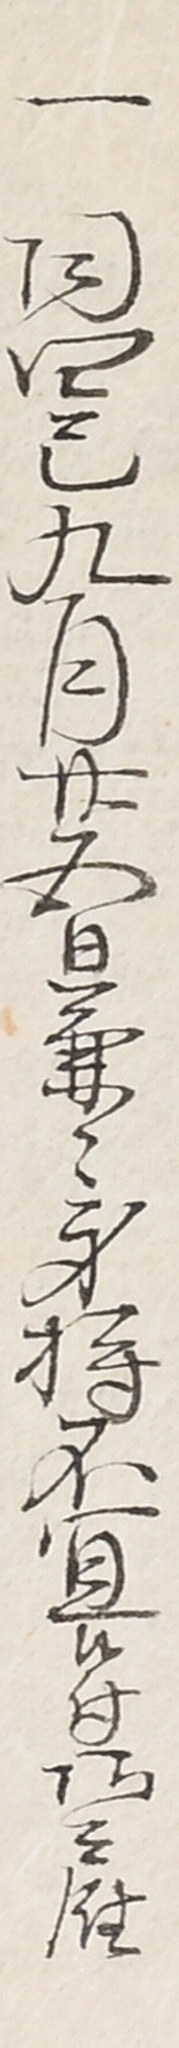一同四巳九月廿五日兼々身持不宜候付御雇
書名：給人諸士勤仕録（七）
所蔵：伊那市立高遠町図書館・合同会社AMANE
